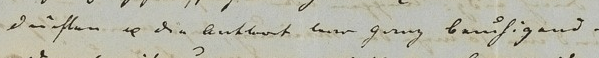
dürften u die Antwort war ganz beruhigend.
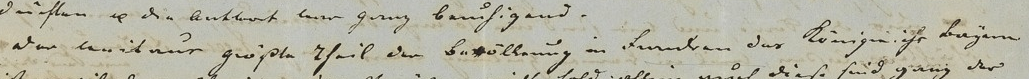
Der weitaus größte Theil der Bevölkerung in Franken des Königreichs Bayern
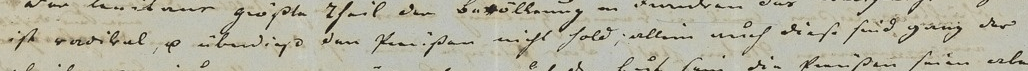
ist radikal, u überdieß den Preussen nicht hold; allein auch diese sind ganz der
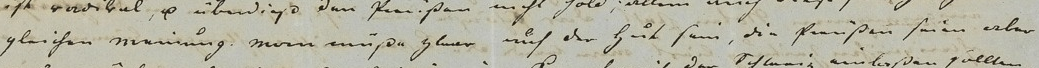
gleichen Meinung. Man müße zwar auf der Hut sein, die Preußen seien aber
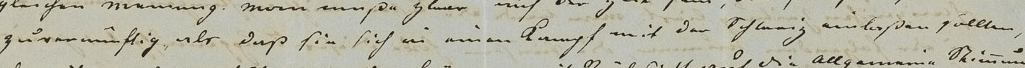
zu vernünftig, als daß sie sich in einen Kampf mit der Schweiz einlaßen sollten,
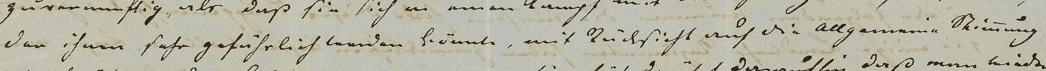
der ihnen sehr gefährlich werden könnte, mit Rücksicht auf die allgemeine Stimmung
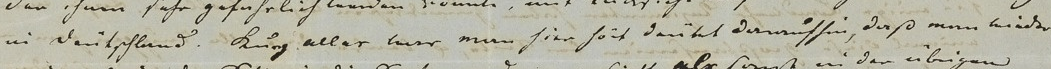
in Deutschland. Kurz alles was man hier hört deutet daraufhin, daß man wieder
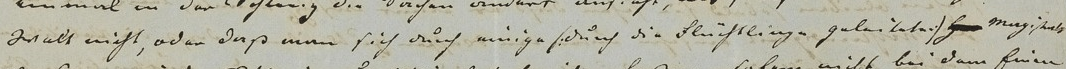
Welt nicht, oder daß man sich durch einige (durch die Flüchtlinge geleiteten) H... Magistrats-
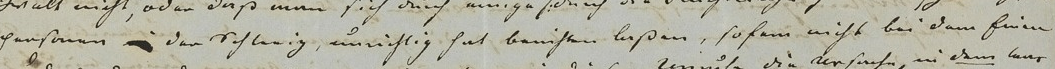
personen in der Schweiz, unrichtig hat berichten laßen, sofern nicht bei dem Einen
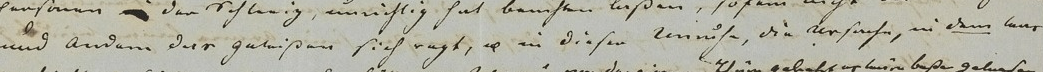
und Andern das Gewißen sich regt, u in dieser Unruhe, die Ursache, in dem was
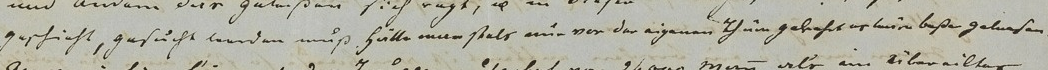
geschieht, gesucht werden muß. Hätte man stets nur vor der eigenen Thüre gekehrt es wäre beßer gelaufen.
